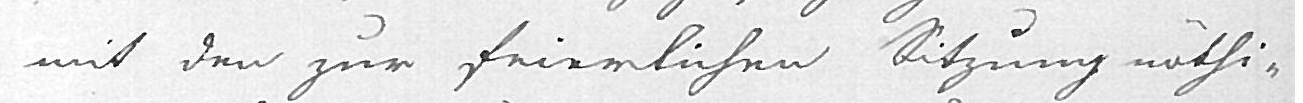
mit den zur feierlichen Sitzung nöthi-
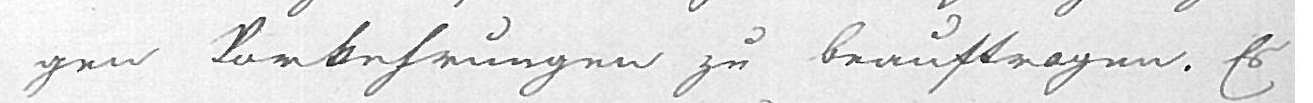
gen Vorkehrungen zu beauftragen. Es
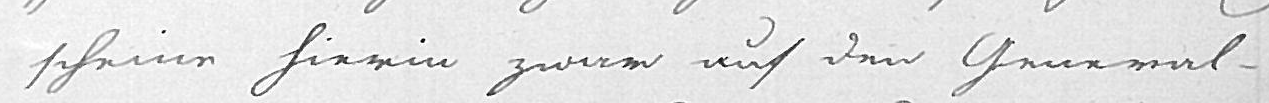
scheine hierin zwar auf den General-
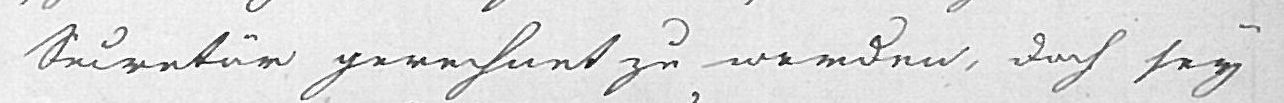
Secretär gerechnet zu werden, doch sey
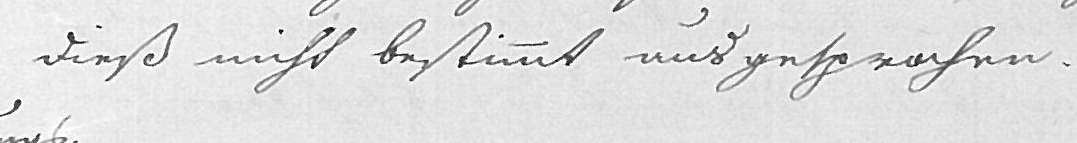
dieß nicht bestimmt ausgesprochen.
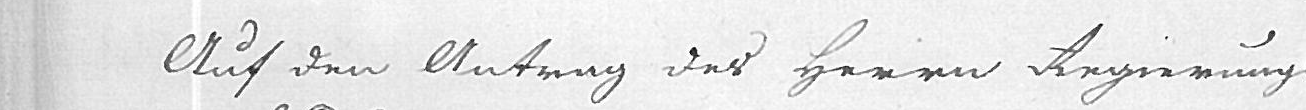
Auf den Antrag des Herrn Regierungs-
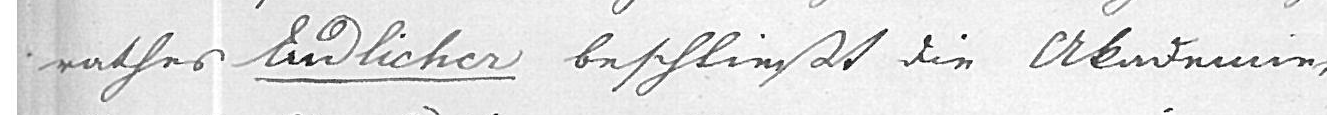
rathes Endlicher beschließt die Akademie,
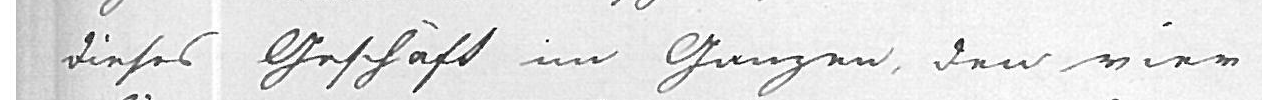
dieses Geschäft im Ganzen, den vier
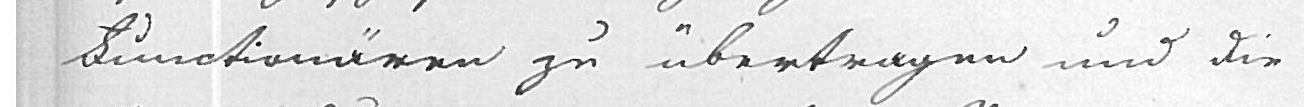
Functionären zu übertragen und die
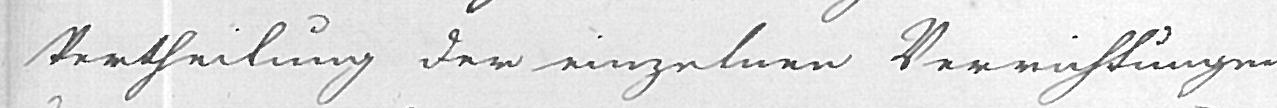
Vertheilung der einzelnen Verrichtungen
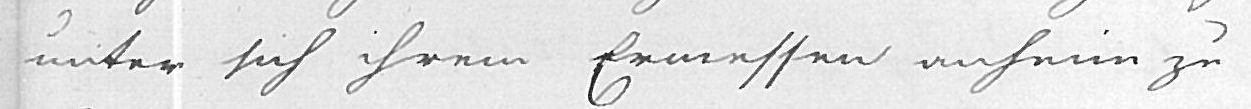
unter sich ihrem Ermessen anheim zu
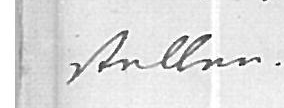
stellen.
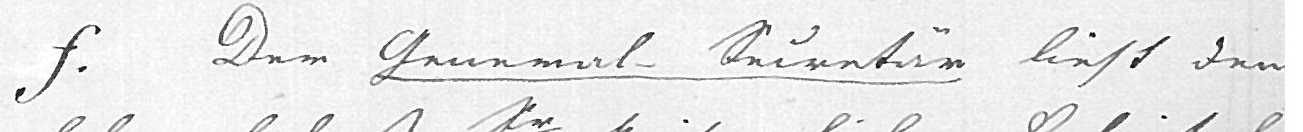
f. Der General-Secretär liest den
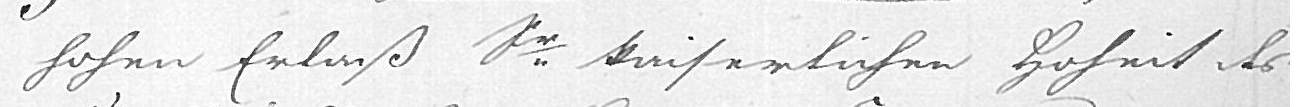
hohen Erlaß Sr. kaiserlichen Hoheit des
